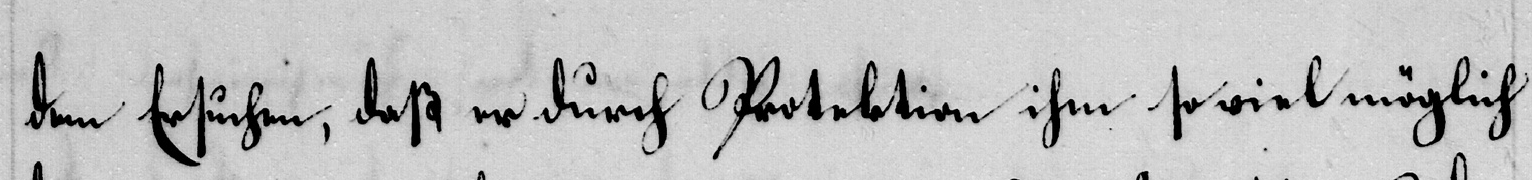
dem Ersuchen, daß er durch Protektion ihm so viel möglich
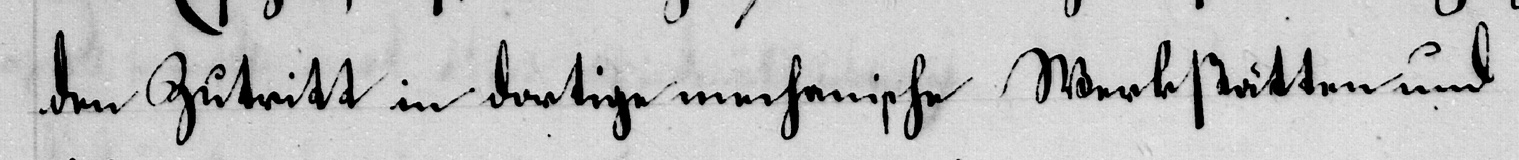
den Zutritt in dortige mechanische Werkstätten und
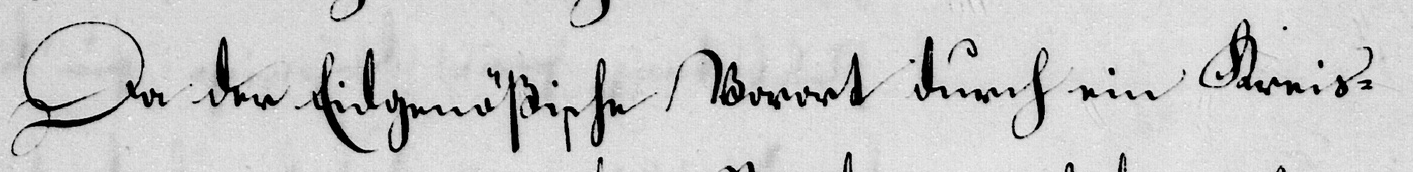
Da der Eidgenößische Vorort durch ein Kreis¬
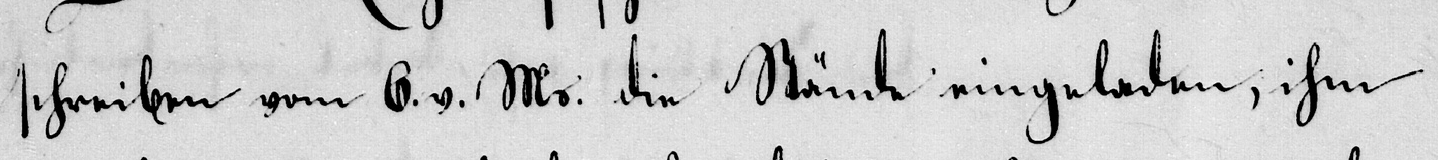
schreiben vom 6. v. Ms. die Stände eingeladen, ihm
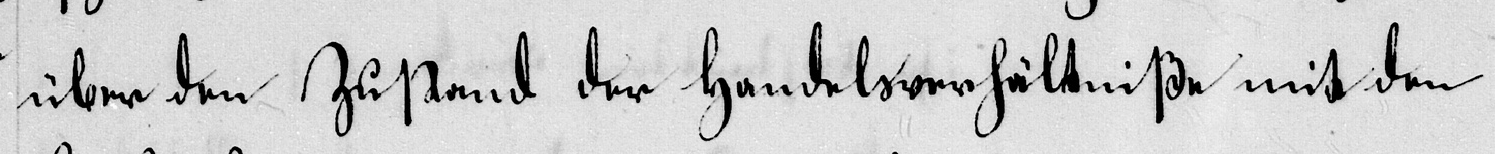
über den Zustand der Handelsverhältniße mit den
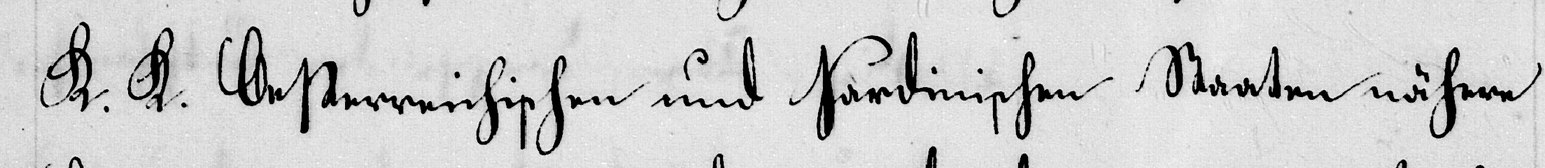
K. K. Osterreichischen und Sardinischen Staaten nähere
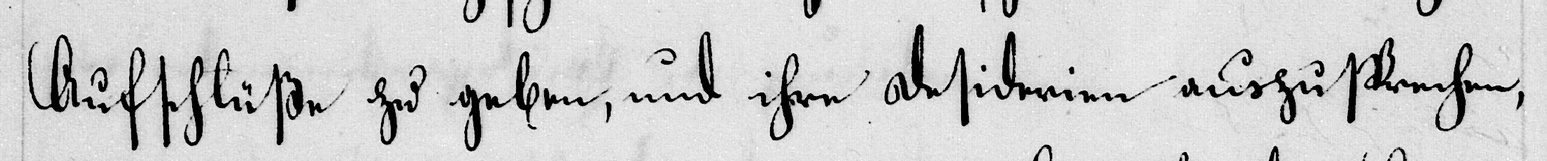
Aufschlüße zu geben, und ihre Desiderien auszusprechen,
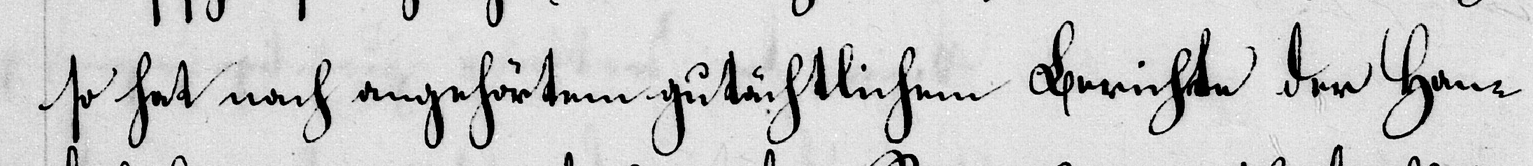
so hat nach angehörtem gutächtlichen Berichte der Han¬
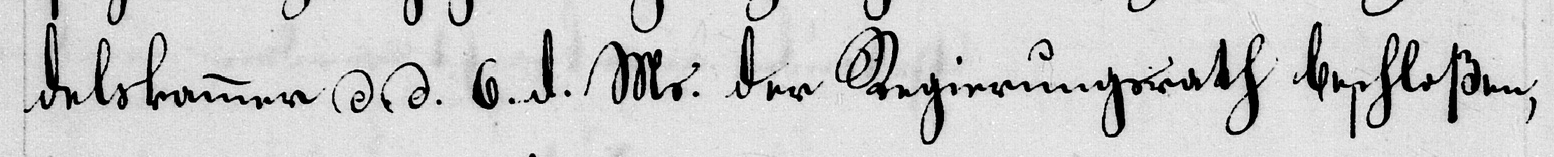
delskammer d. d. 6. d. Ms. der Regierungsrath beschloßen,
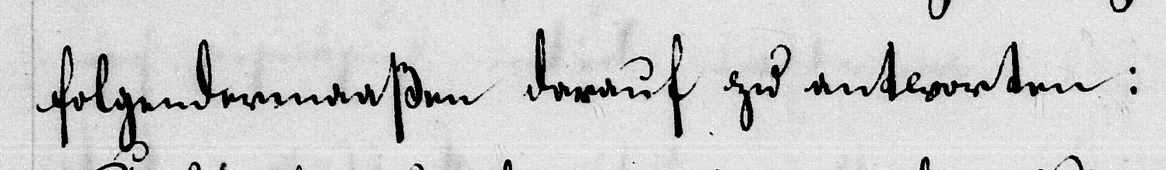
folgendermaaßen darauf zu antworten:
